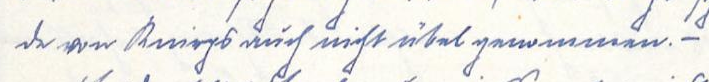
de von Knirps auch nicht übel genomnen.
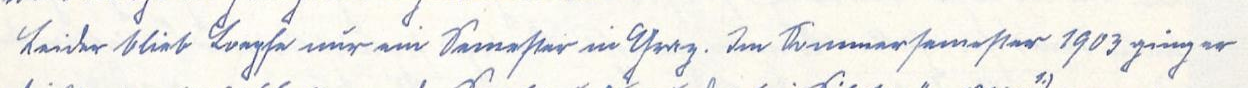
Leider blieb Loepfe nur ein Semester in Graz. Im Sommersemester 1903 ging er
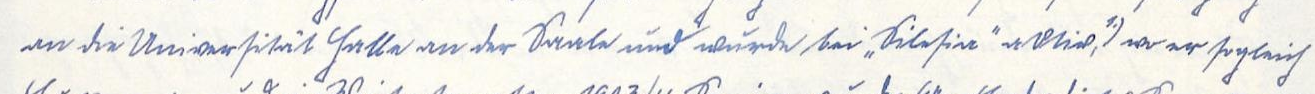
an die Universität Halle an der Saale und wurde bei „Silesia“ aktiv 1) wo er sogleich
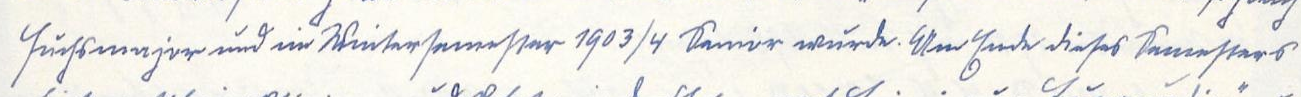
Fuchsmajor und im Wintersemester 1903/4 Senior wurde. Am Ende dieses Semesters
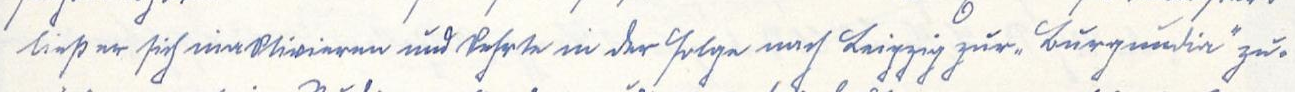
ließ er sich inaktivieren und kehrte in der Folge nach Leipzig zur „Burgundia“ zu-
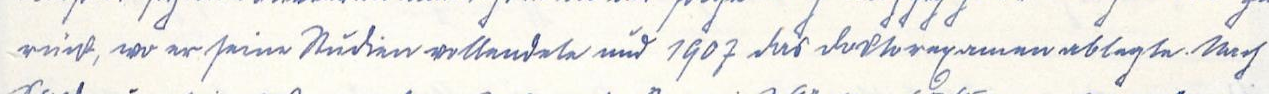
rück, wo er sein Studien vollendete und 1907 das Doktorexamen ablegte. Nach
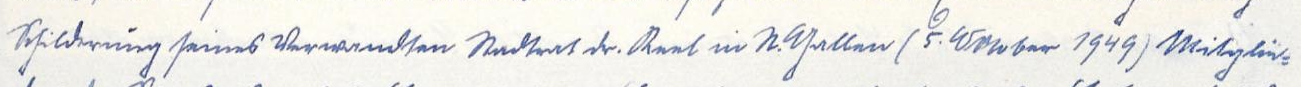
Schilderung seines Verwandten Stadtrat Dr. Keel in St. Gallen (5. Oktober 1949) Mitglie-
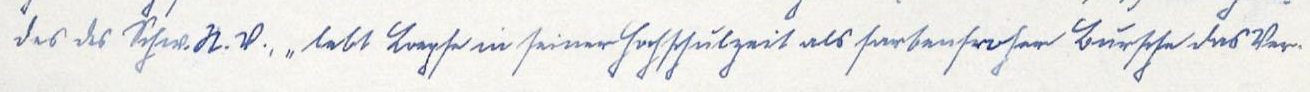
des des Schw. St. V, "lebt Loepfe in seiner Hochschulzeit als farbenfrohe Bursche das Ver-
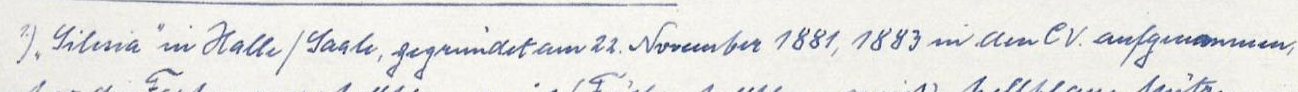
1) Silesia" in Halle (Saale, gegründet am 22. November 1881, 1883 in den CV aufgenommen,
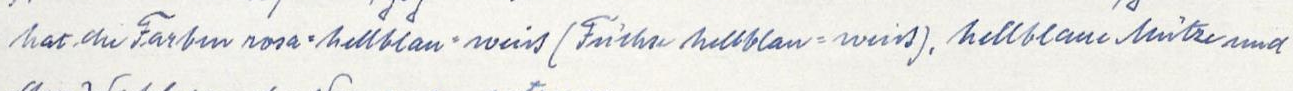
hat die Farben rosa-hellblau- weiß (Fuchs hellblau -weiß) hellblaue Mütze und
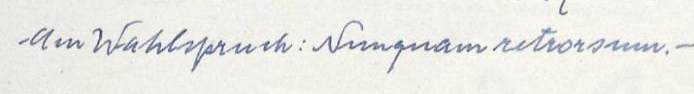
den Wahlspruch: Nunquam retrorsum
